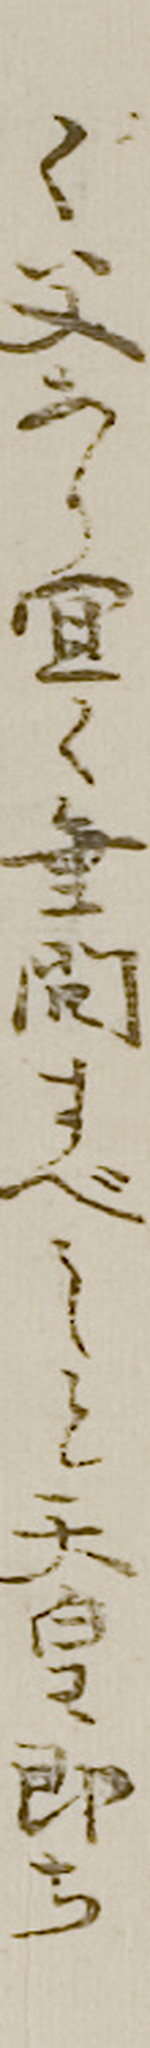く父あり宜く垂問すべしと天皇即ち
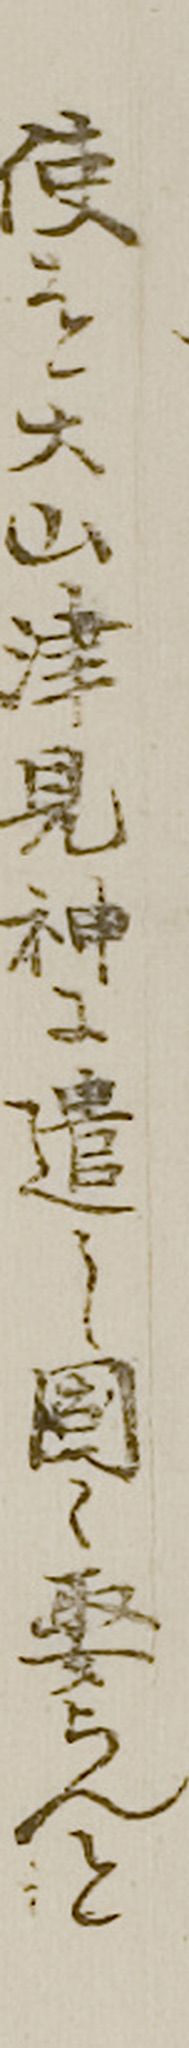使を大山津見神に遣し固く娶らんと
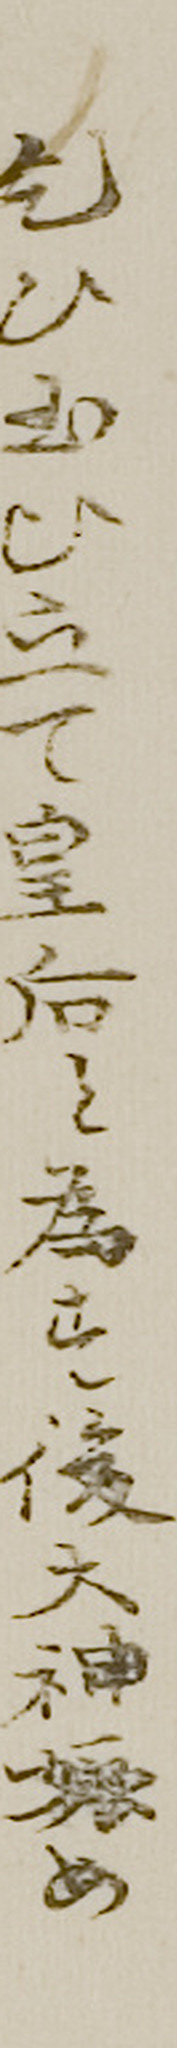乞ひ玉ひ立て皇后と為す後大神娠め
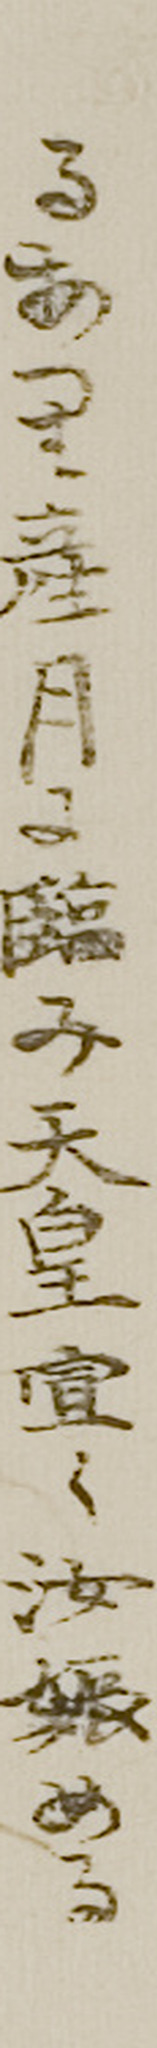るあり産月に臨み天皇宜く汝娠める
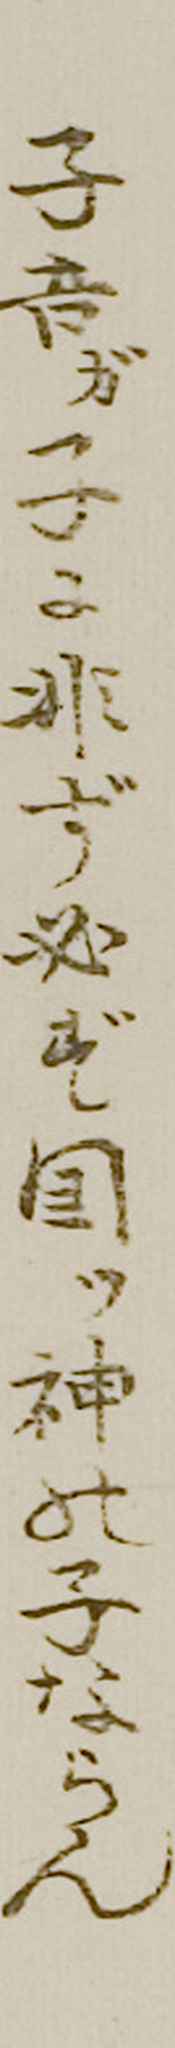子吾が子に非ず必ず国ッ神の子ならん
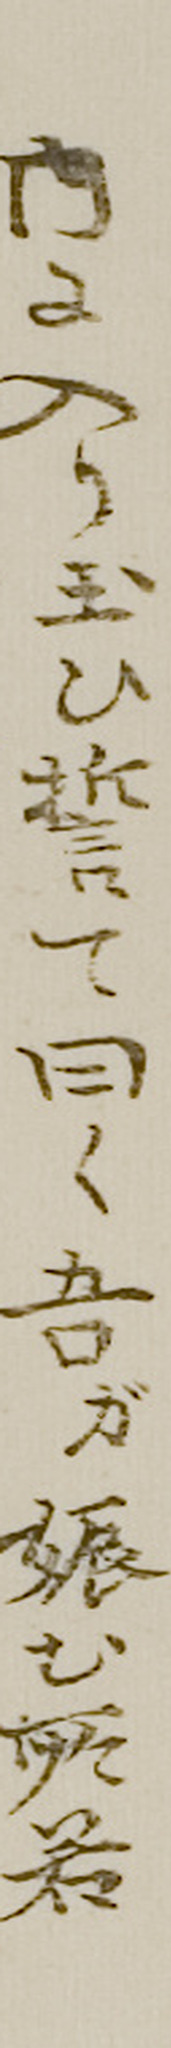内に入り玉ひ誓て曰く吾が娠む所若
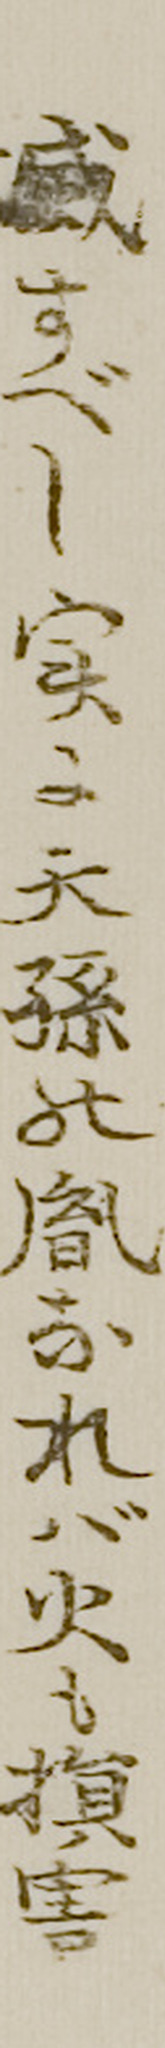滅すべし実に天孫の胤なれば火も損害
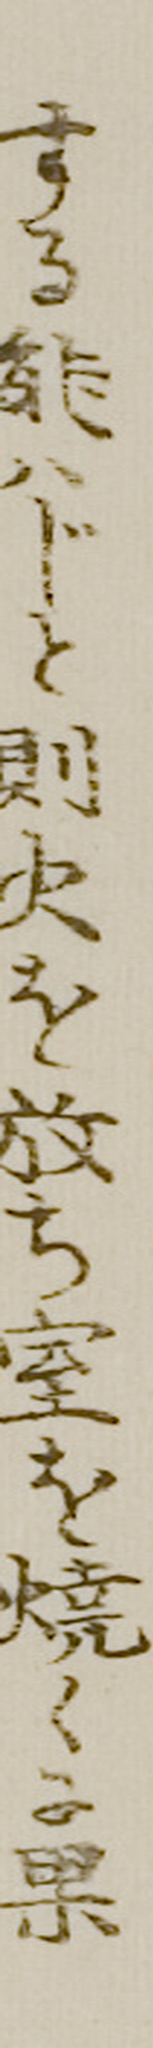する能はじと則火を放ち室を焼くに果
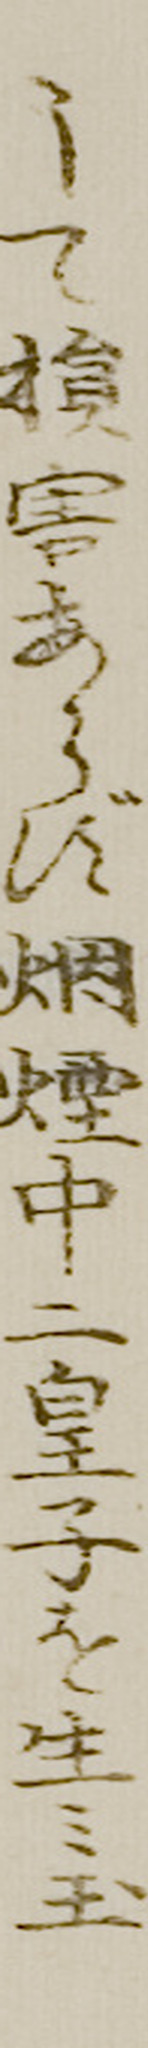して損害あらず烟煙中二皇子を生み玉
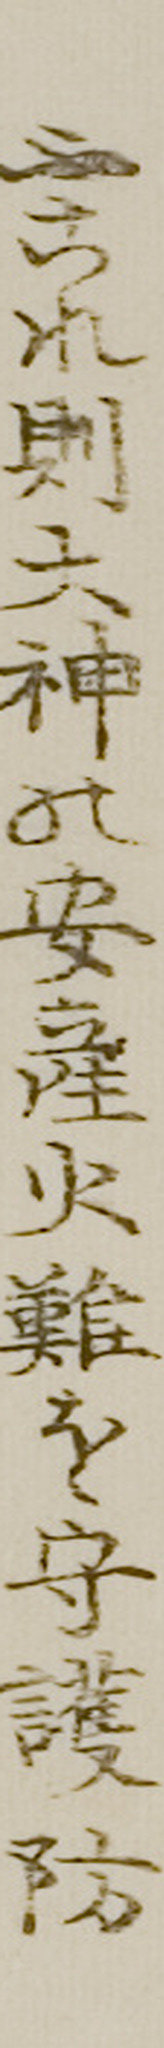ふこれ則大神の安産火難を守護防
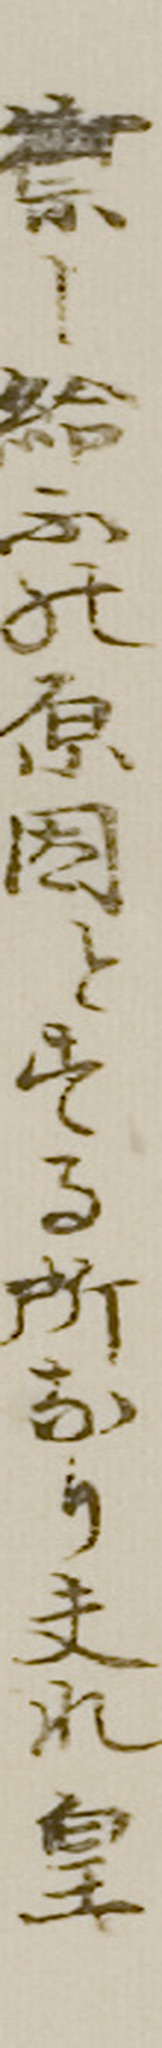禦し給ふの原因とする所なり夫れ皇
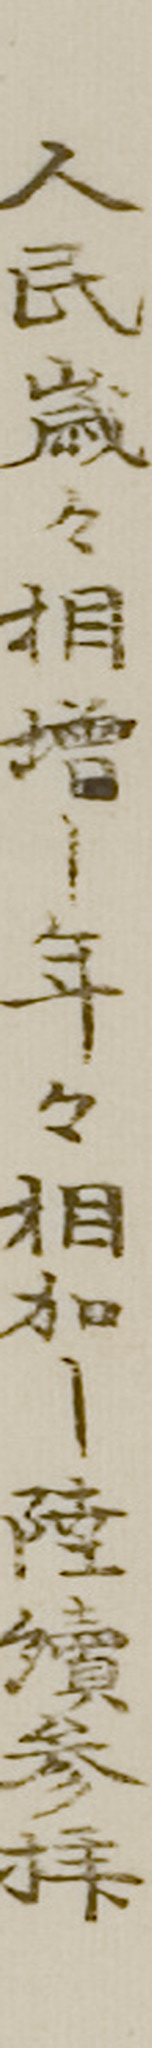人民歳々相増し年々相加し陸続参拝
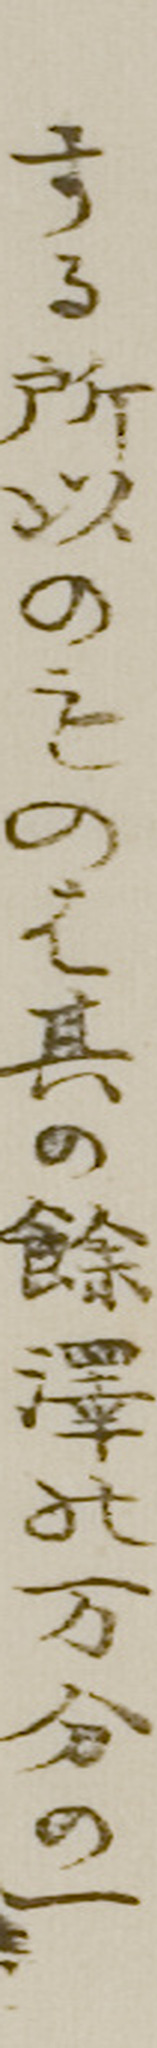する所以のものは其の余沢の万分の一
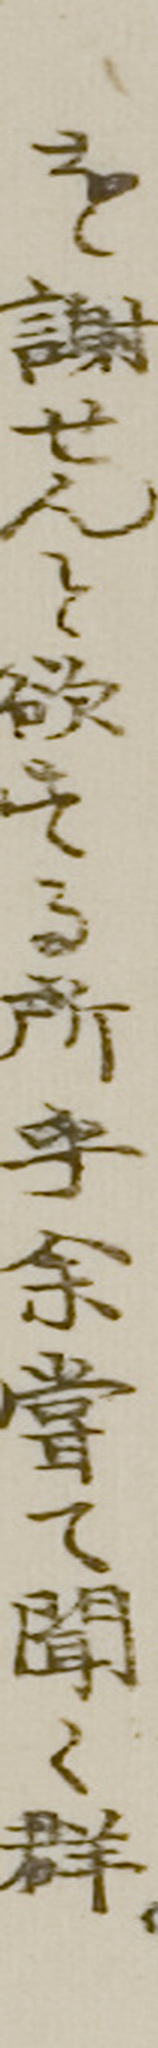を謝せんと欲する所乎余嘗て聞く群
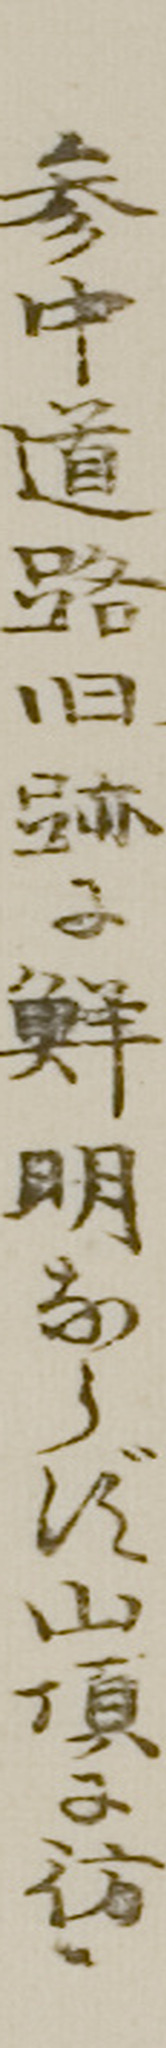参中道路旧跡に鮮明ならず山頂に彷
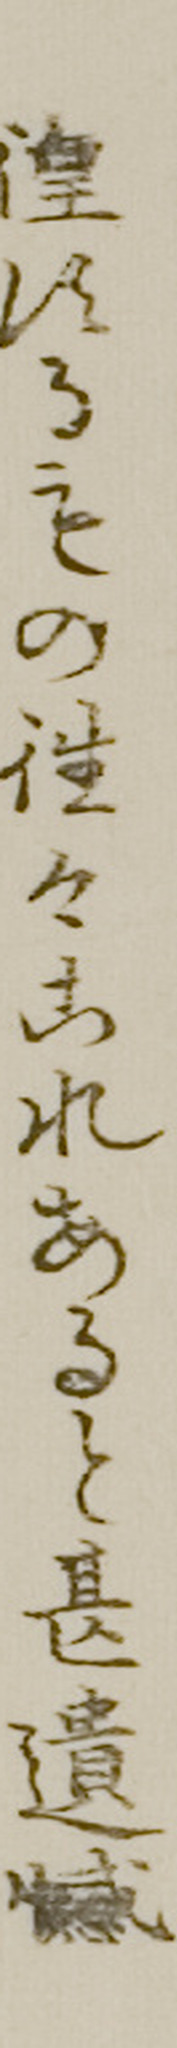徨するもの往々これあると甚遺憾
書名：富士山頂上八峯内院并諸国遠見図
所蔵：東京大学総合図書館 General Library in the University of Tokyo, JAPAN
